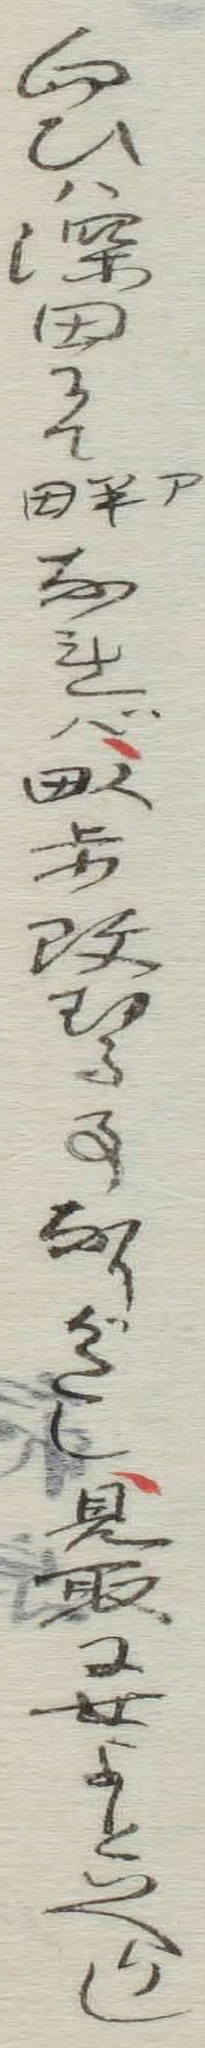向ひは深田にて畔なれば、畝歩改むる事なりがたし、見取にせよといへりし
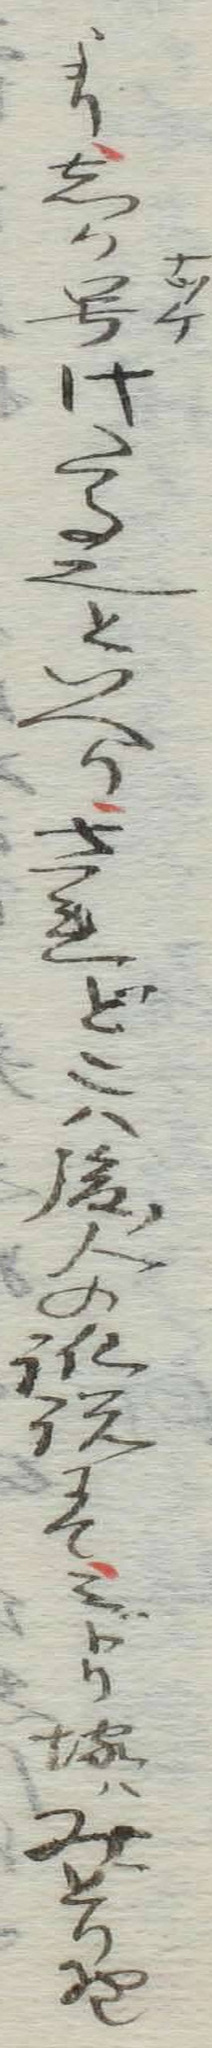より、しか号けたる也といへり、されどこは後ノ人の訛説にて、ミドリ塚はみどり野
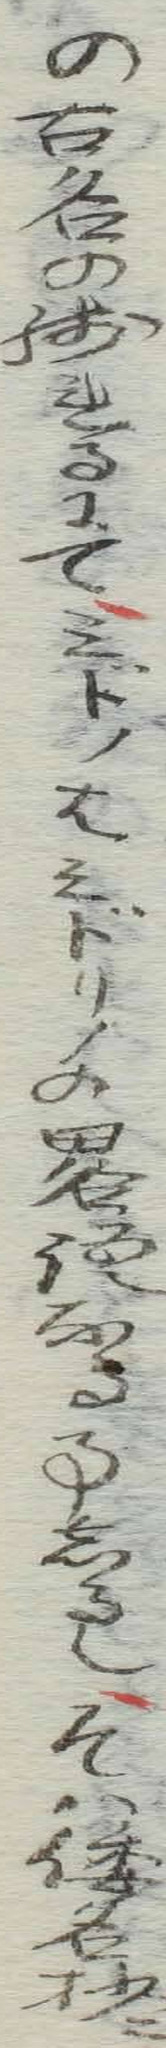の古名の残れるにて、ミドノはミドリノの略語なる事しるし、そは倭名抄ニ
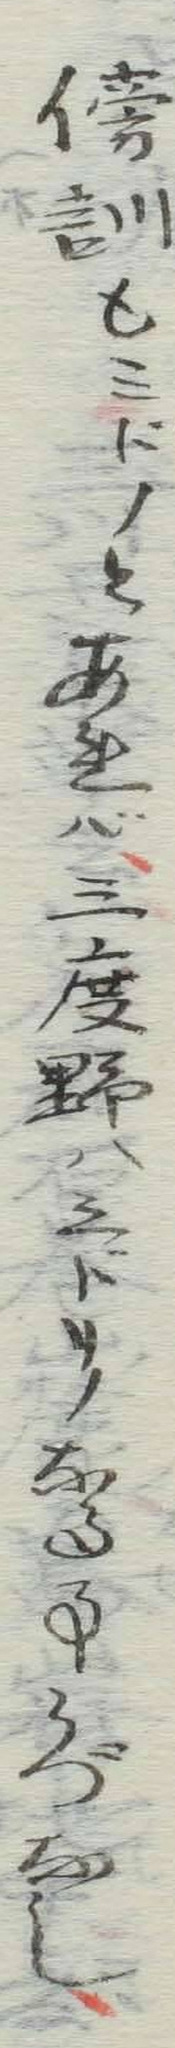傍訓もミドノとあれば、三度野はミドリノなる事うづなし、
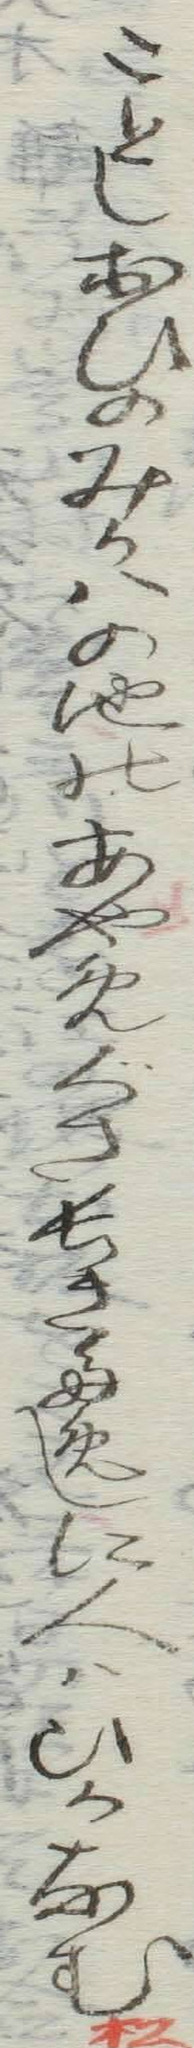ことしおひのみかはの池のあやめぐさ長きためしに人はひかなむ松イセ
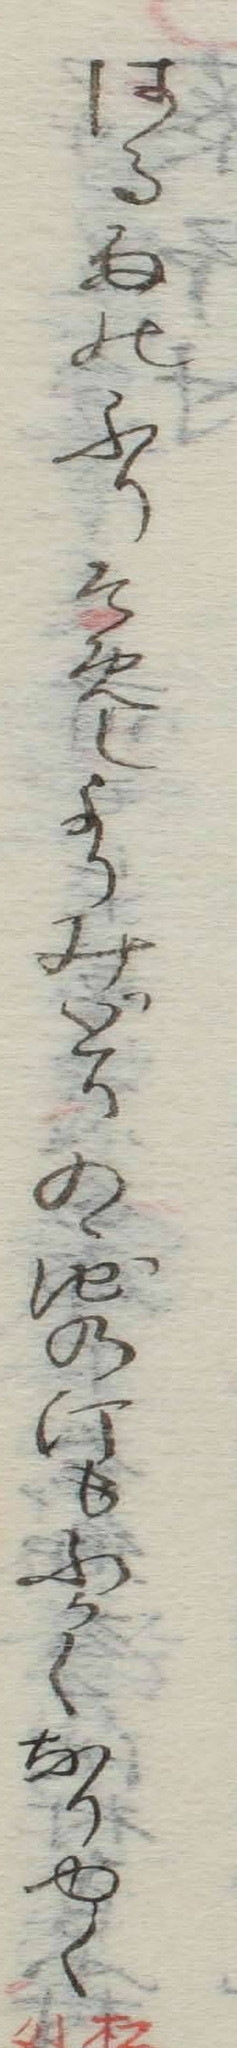はる雨のふりそめしよりみどりのゝ池の汀もふかくなりゆく松外

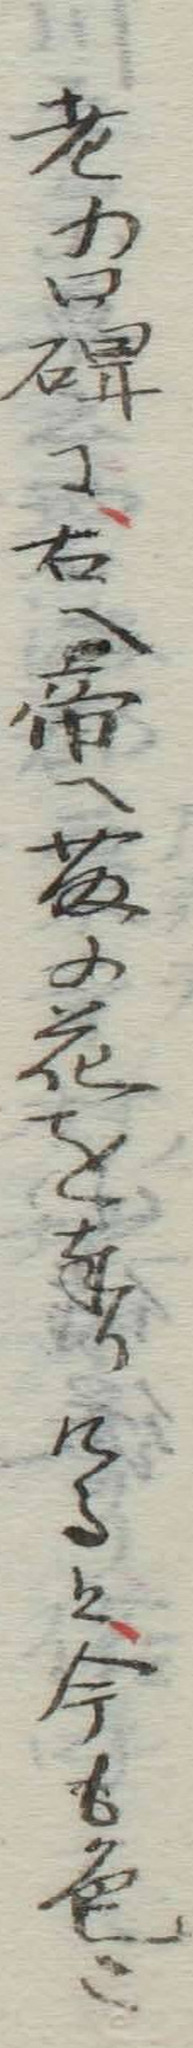老の口碑に、古へ帝へ藤の花を奉りけると、今も色こ
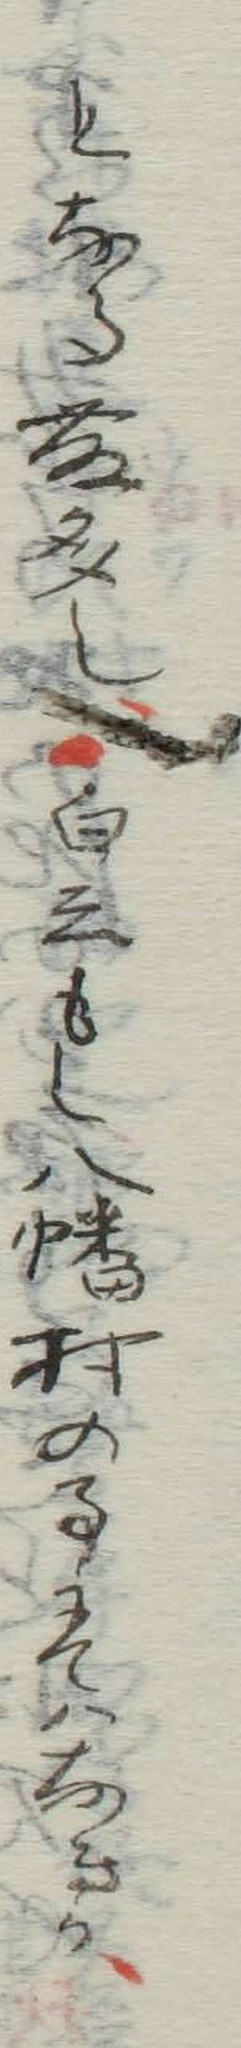となる藤多し、●白云もし八幡村の事にてはなきか、
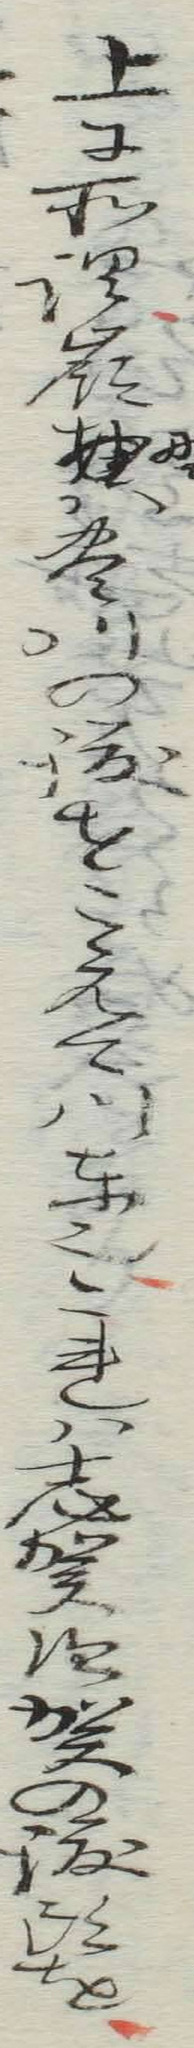上に所謂、嶺野は豊川の渡をこえて川東也、これは志賀須賀の渡頭を、
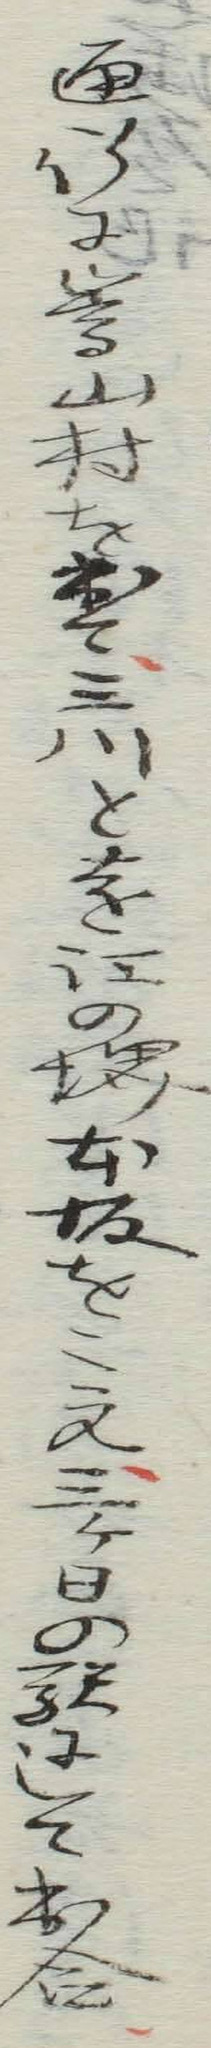通行に嵩山村を出て、三川と遠江の堺本坂をこえ、三ケ日の駅にして出合、
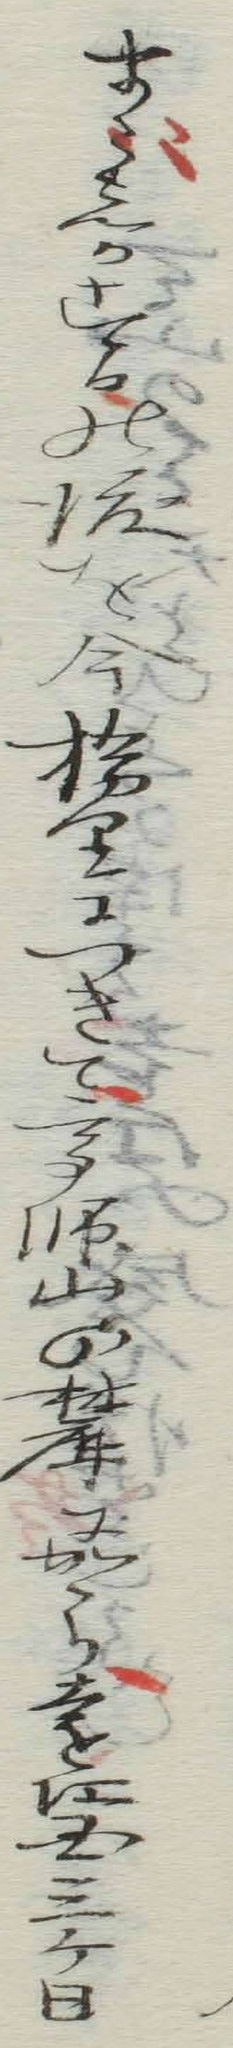またしかすかの渡を今橋里につきて、高師山の麓にかゝり、遠江国三ケ日
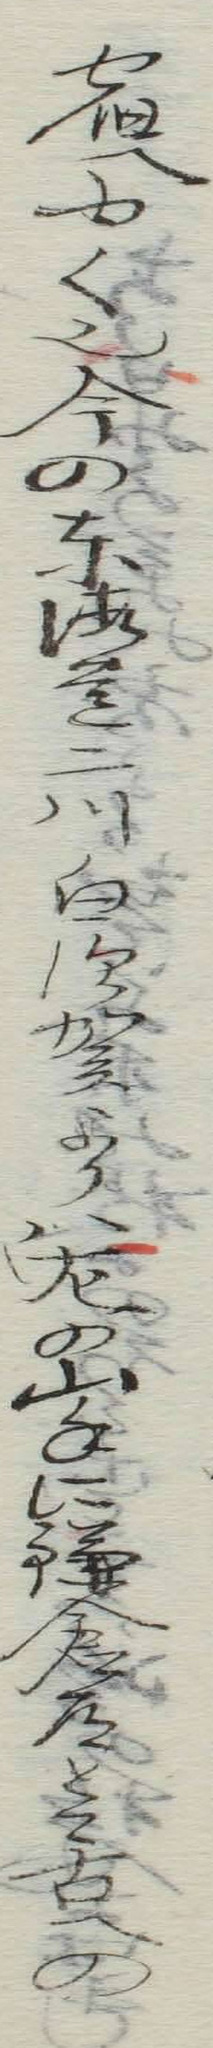宿へゆく也、今の東海道二川白須賀よりは、左の山手に鎌倉道とて古への
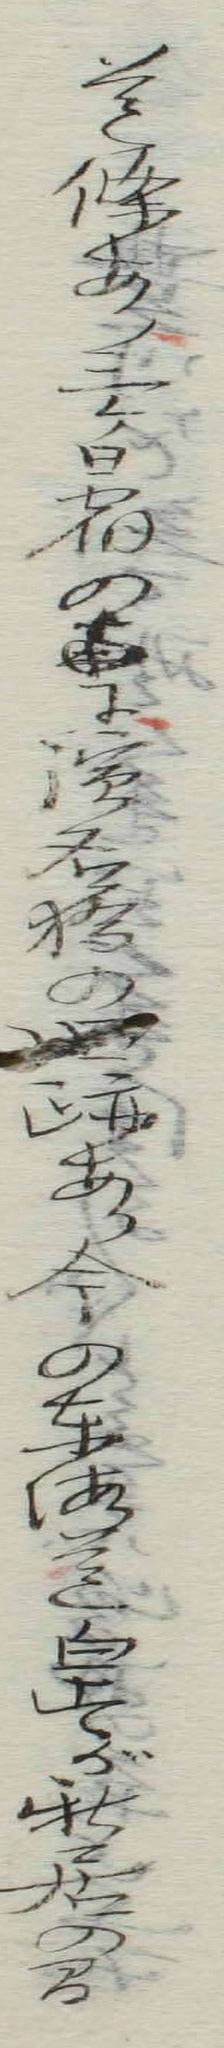道條あり、三ケ日宿の南に、浜名橋の旧跡あり今の東海道白すが新居の間
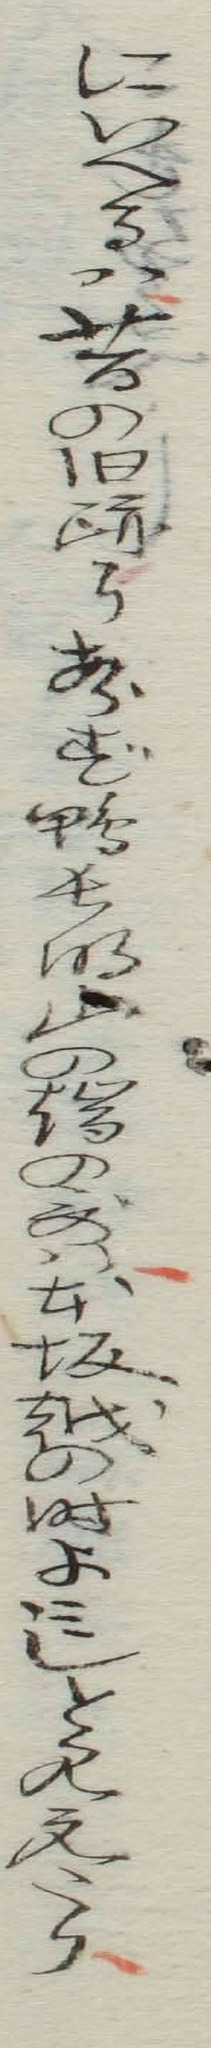にいへるは、昔の旧跡にあらず鴨長明山の端の歌は、本坂越の時よみしと見えたり、
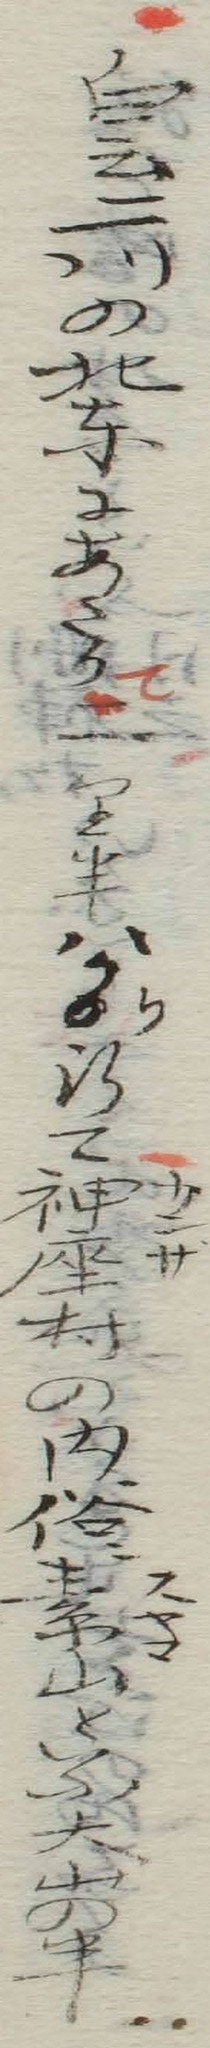●白云二川の北東にあたりて、一里半はかり行て、神座村の内俗ニ素山といふ大山の半

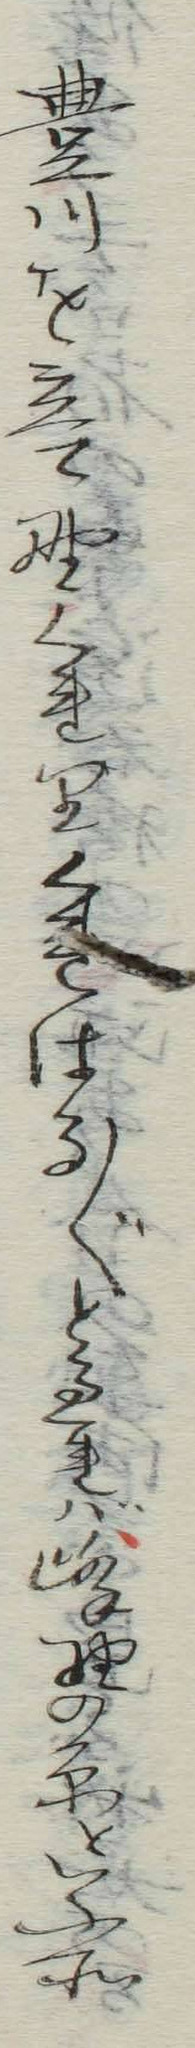豊川を立て野くれ里くれはる〴〵と過れば、峰野の原といふ所
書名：三河国古跡考
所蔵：国文学研究資料館
